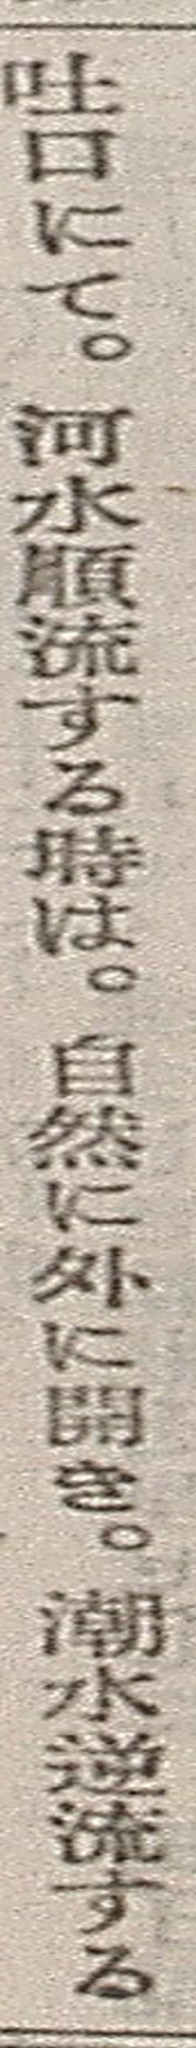吐口にて。河水順流する時は。自然に外に開き。湖水逆流する
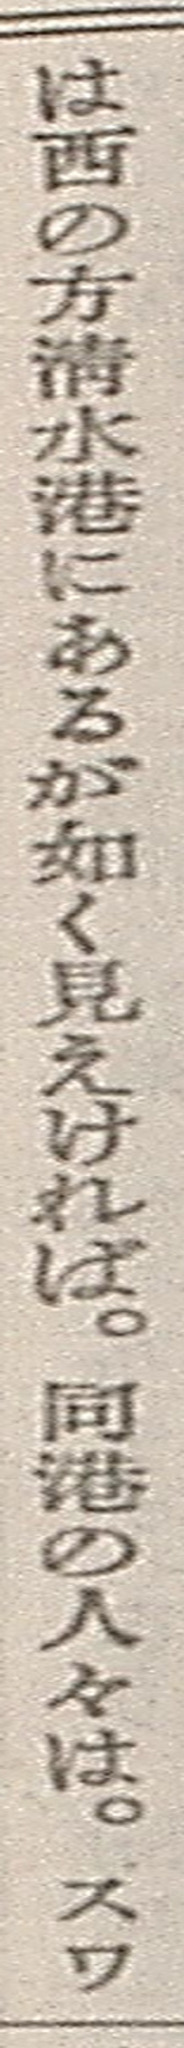は西の方清水港にあるが如く見えければ。同港の人々は。スワ
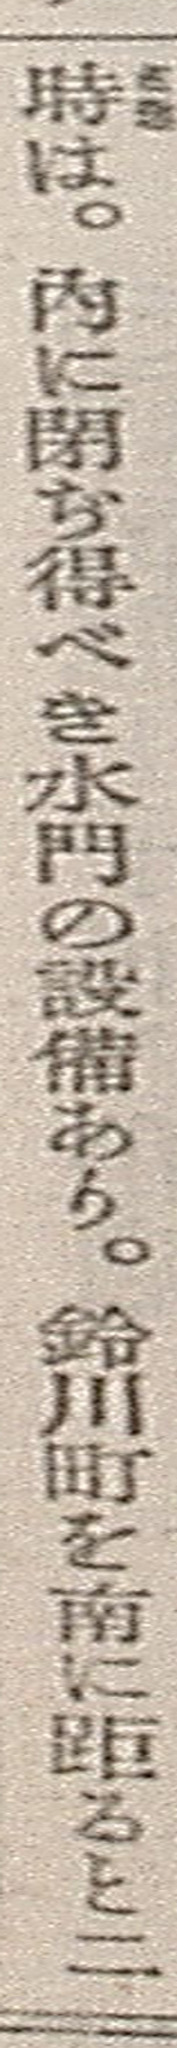時は。内に閉ぢ得べき水門の設備あり。鈴川町を南に距ること二

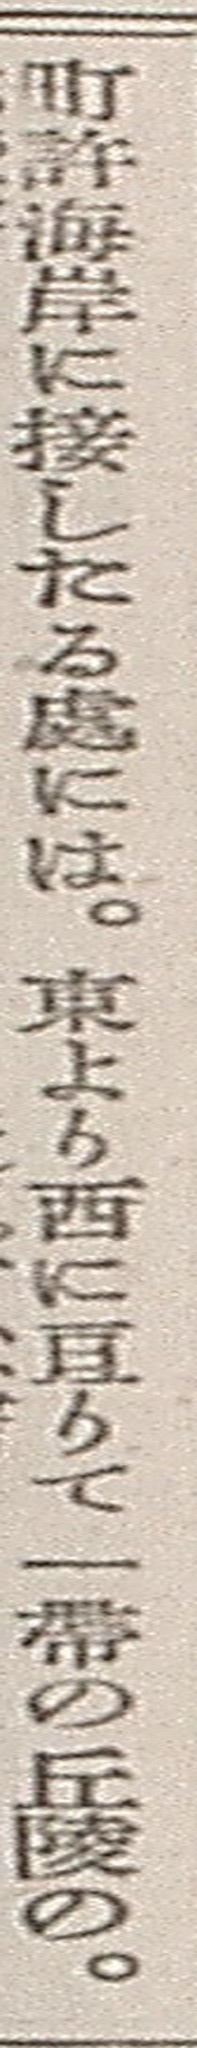町許海岸に接したる処には。東より西に亘りて一帯の丘陵の。
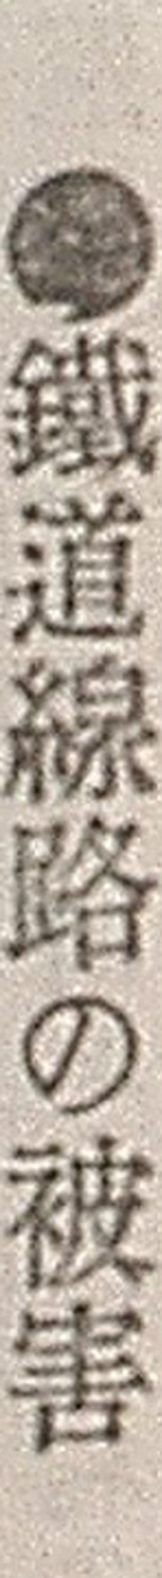●鉄道線路の被害
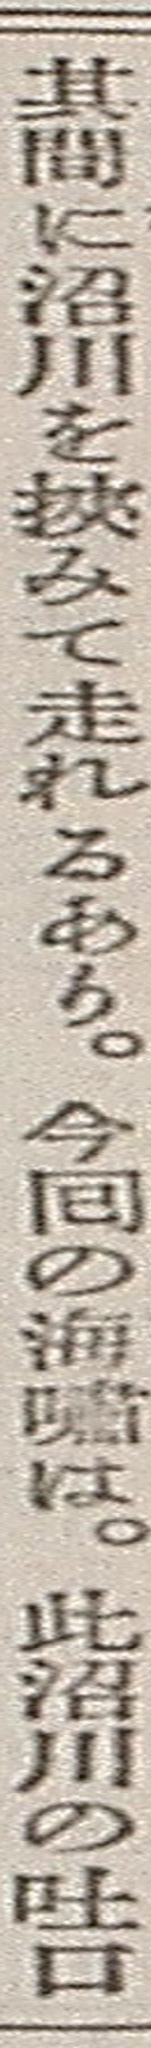其間に沼川を挟みて走れるあり。今回の海嘯は。此沼川の吐口
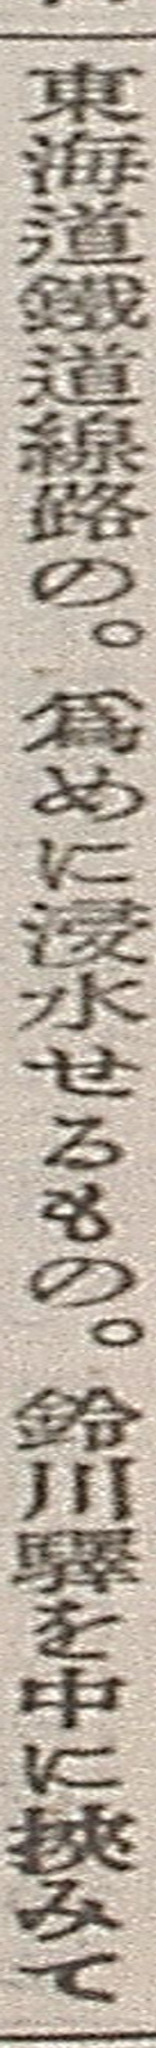東海道鉄道線路の。為めに浸水せるもの。鈴川駅を中に挟みて
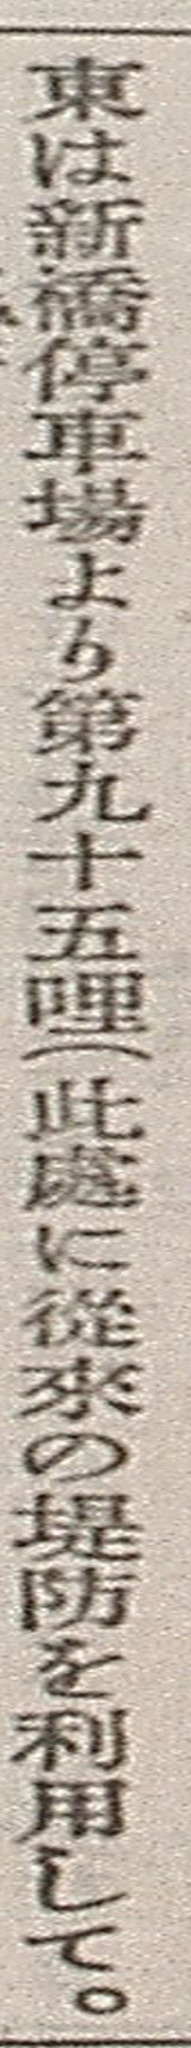東は新橋停車場より第九十五哩（此処に従来の堤防を利用して。
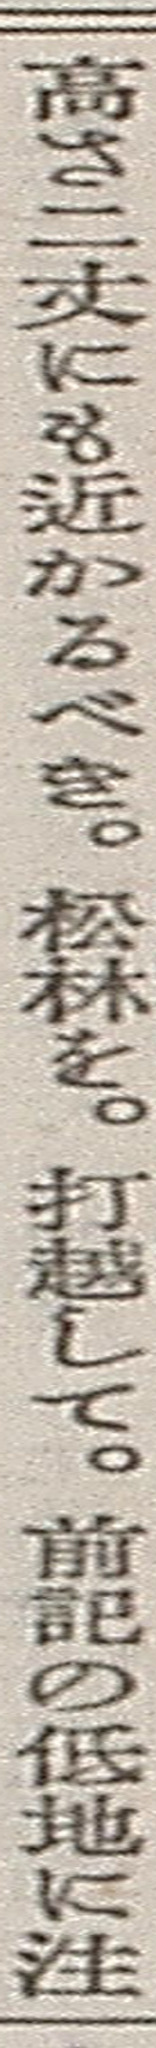高さ二丈にも近かるべき。松林を。打越して。前記の低地に注
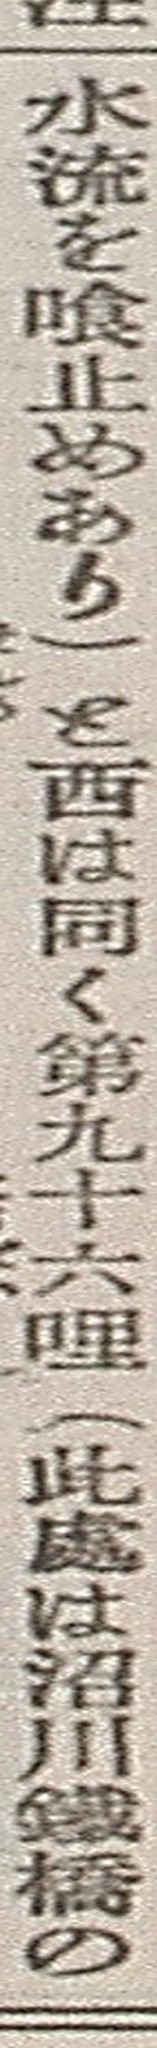水流を喰止めあり）と西は同く第九十六哩（此処は沼川鉄橋の
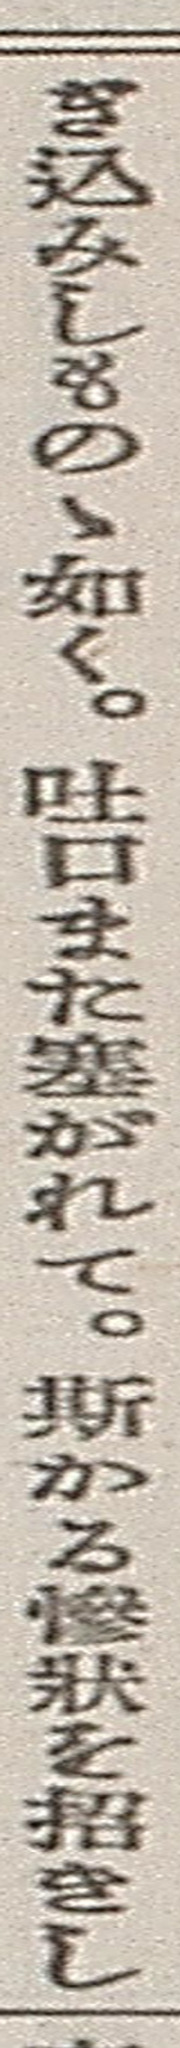ぎ込みしものゝ如く。吐口また塞がれて。斯かる惨状を招きし
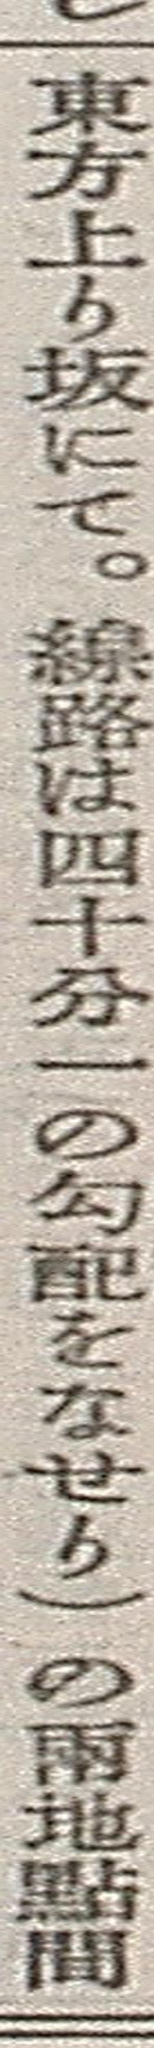東方上り坂にて。線路は四十分一の勾配をなせり）の両地点間
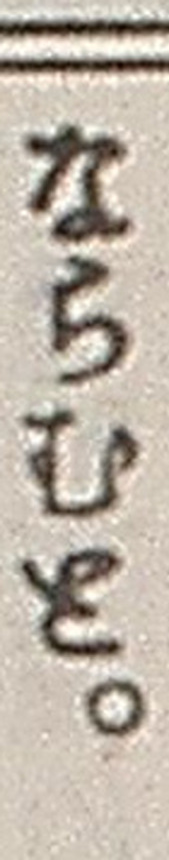ならむと。
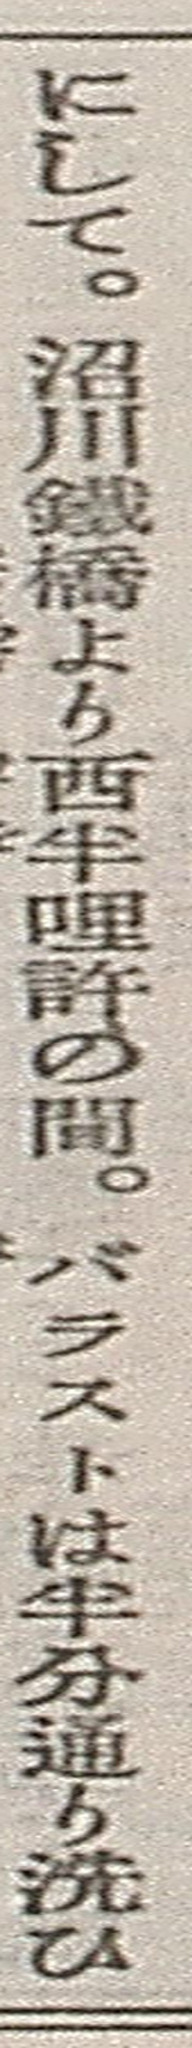にして。沼川鉄橋より西半哩許の間。バラストは半分通り洗ひ
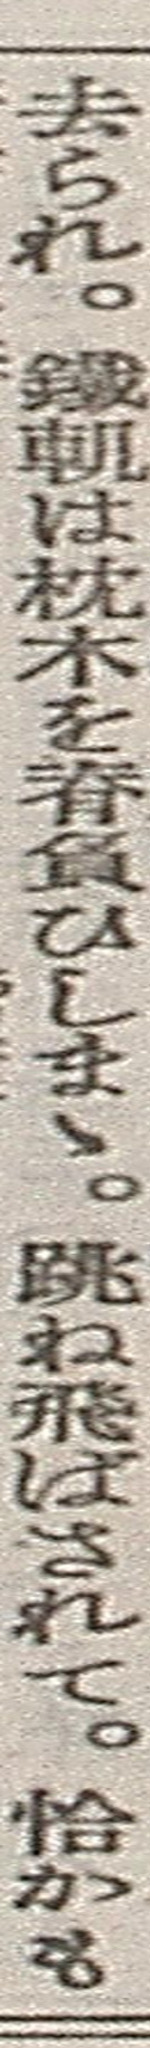去られ。鉄軌は枕木を背負ひしまゝ。跳ね飛ばされて。恰かも
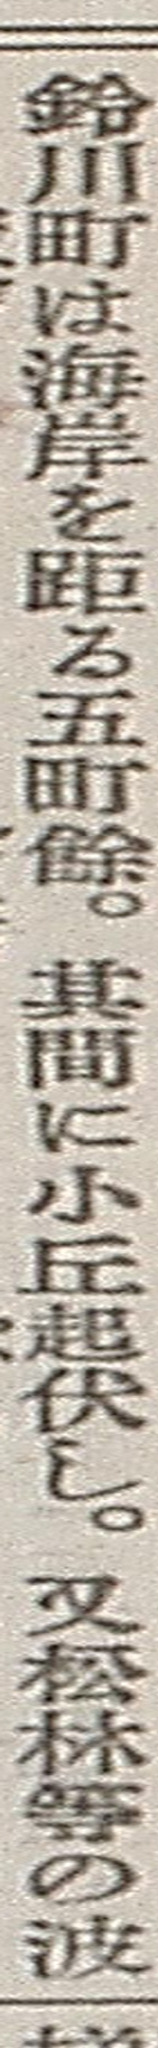鈴川町は海岸を距る五町余。其間に小丘起伏し。又松林等の波
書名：風俗畫報臨時増刊第百九十九號　明治三十二年十月各地災害圖會（前編之續）
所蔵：東京大学地震研究所図書室 Earthquake Research Institute Library, The University of Tokyo, JAPAN
